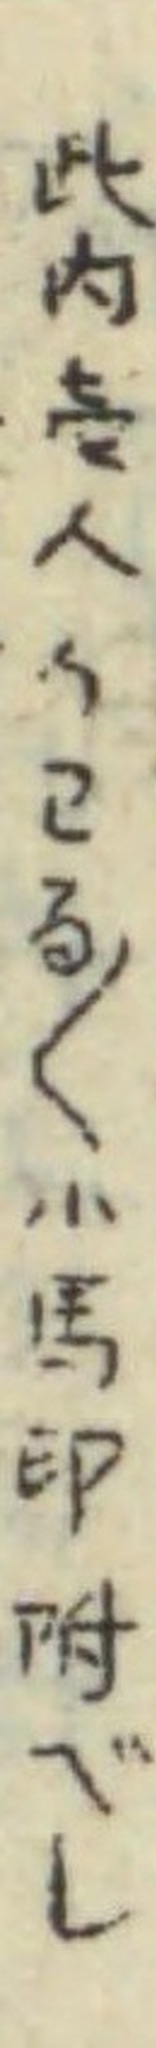此内壱人かわる〳〵小馬印附べし
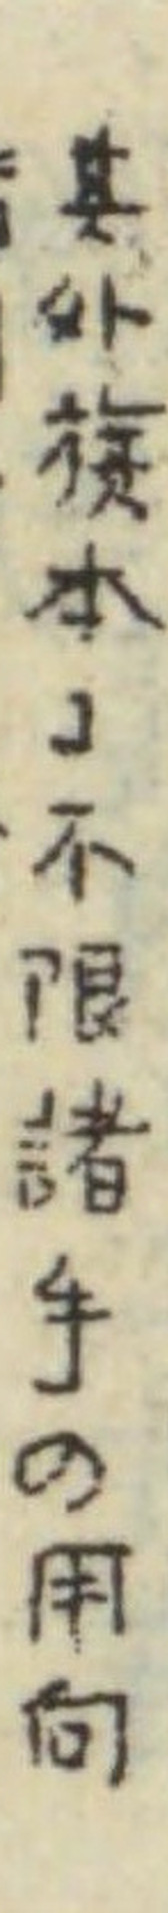其外旗本に不限諸手の用向

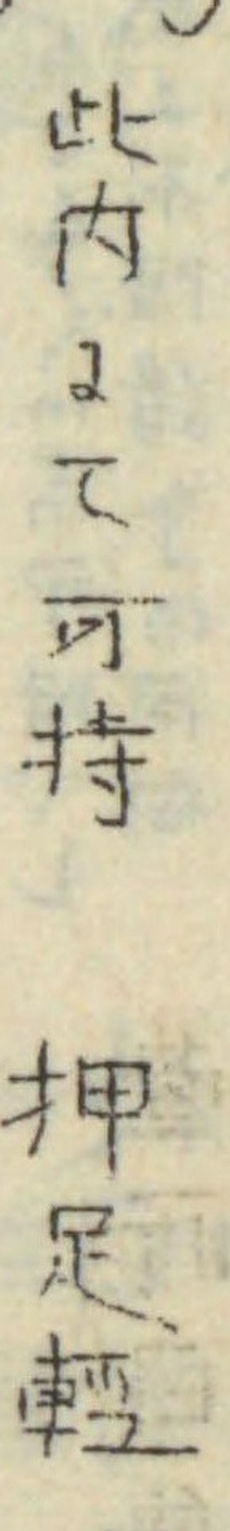此内にて可持押足軽
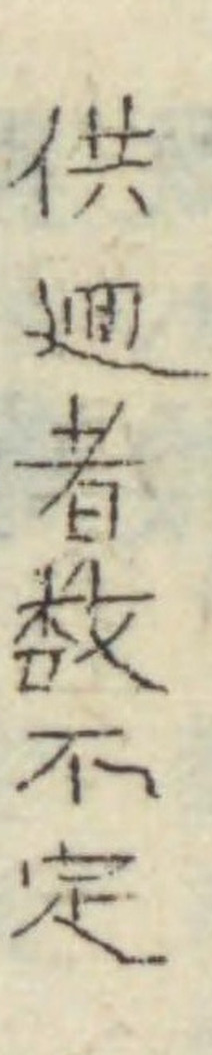持鎗供廻者数不定
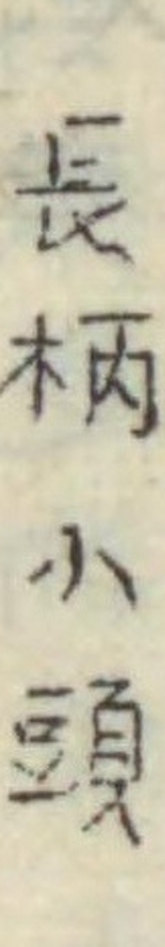長刀小頭
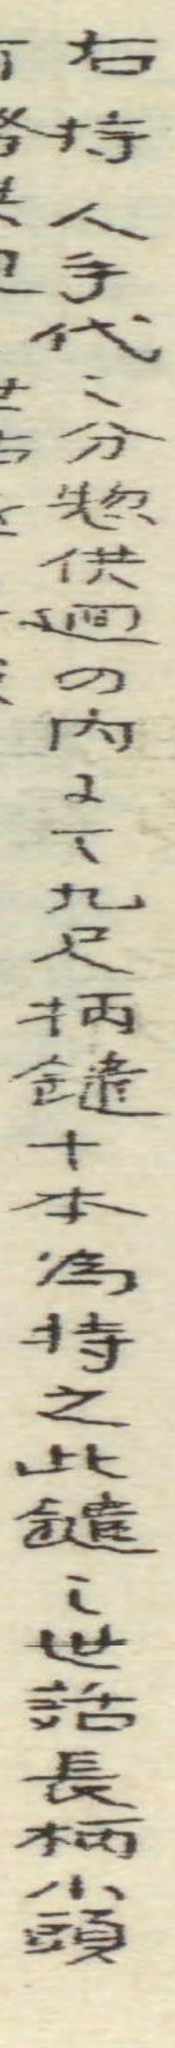右持人手代之分惣供廻の内にて九尺柄鎗十本為持之此鎗之世話長柄小頭
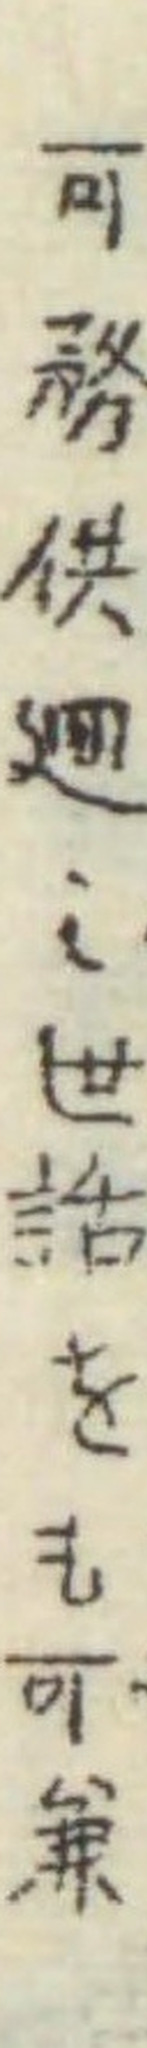可務供廻之世話をも可兼
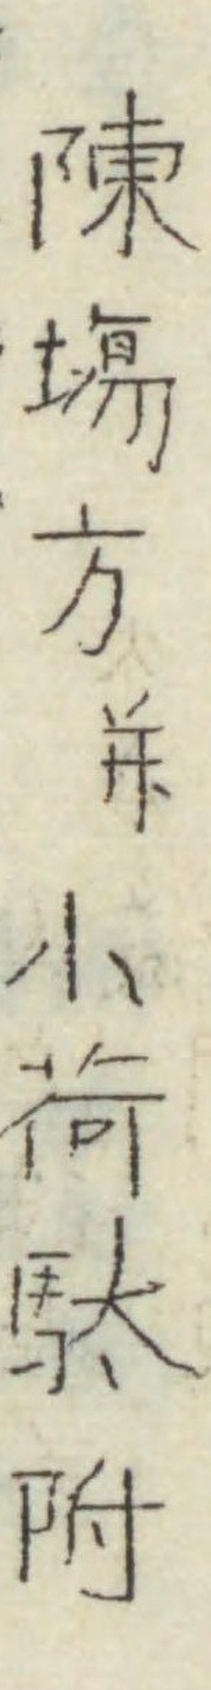陣馬方并小荷駄附
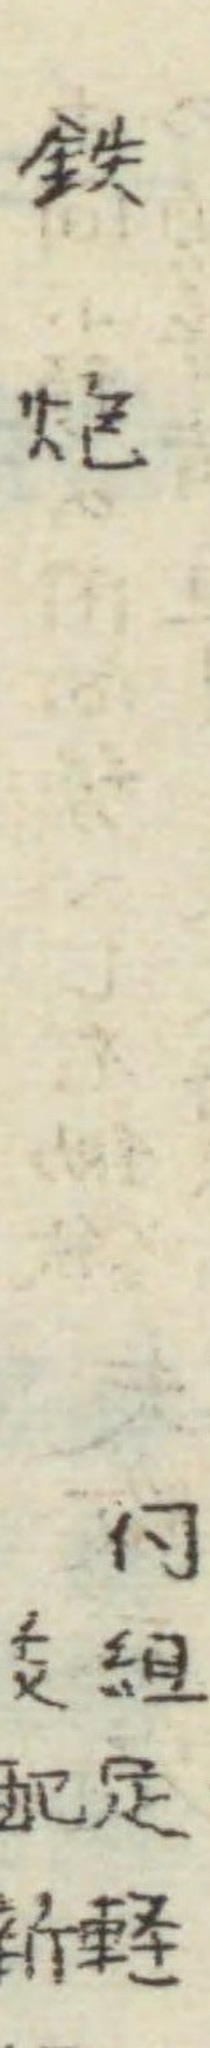鉄炮同支配足軽
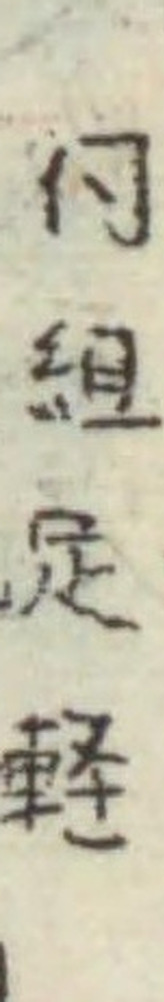同組足軽
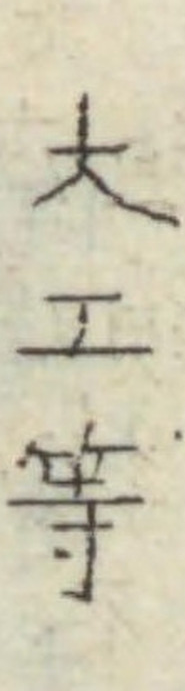大工等
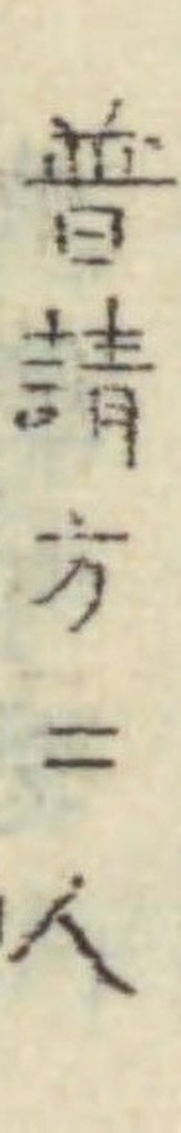普請方二人
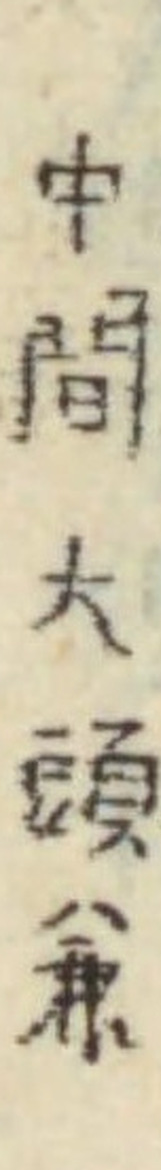中間大頭兼
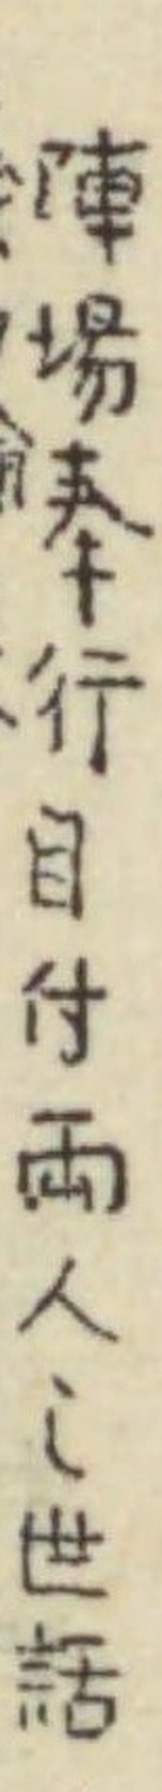陣馬奉行目付両人之世話
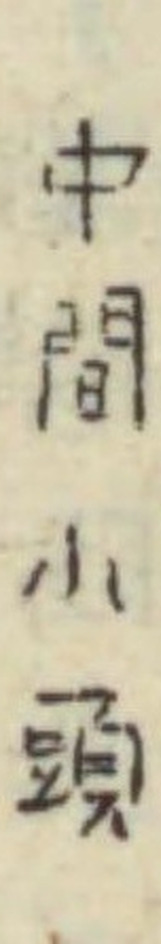中間小頭
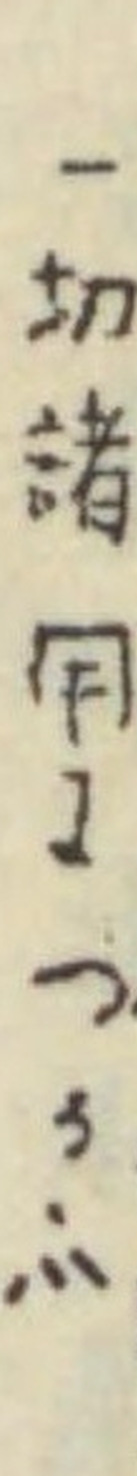一切諸用につかふ
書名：三河吉田藩動員史料
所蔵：国立国会図書館 National Diet Library, JAPAN
